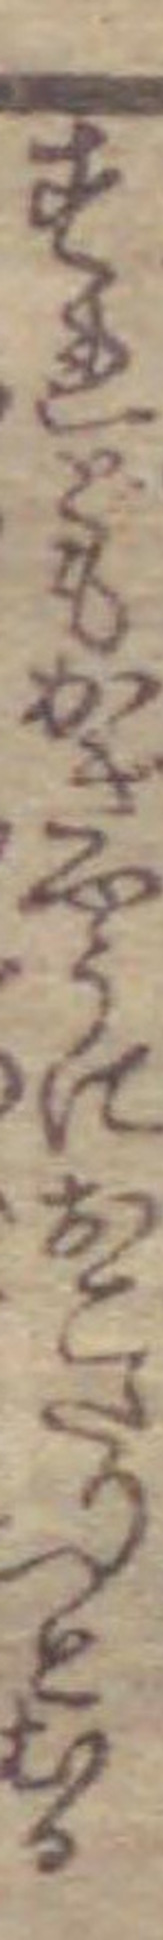すれどもかぎやうにおこたりつとむる
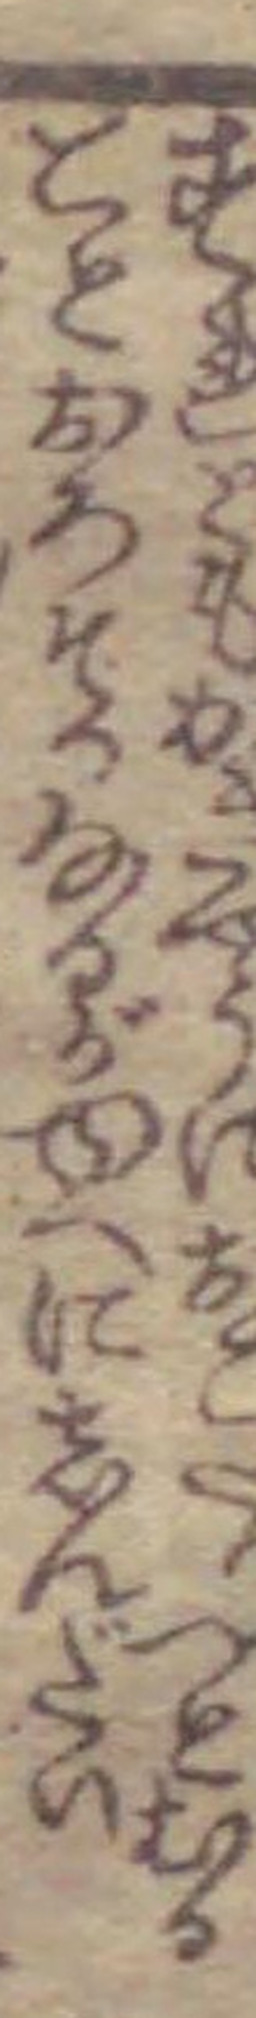ことおろそかなるがゆへにしんだい
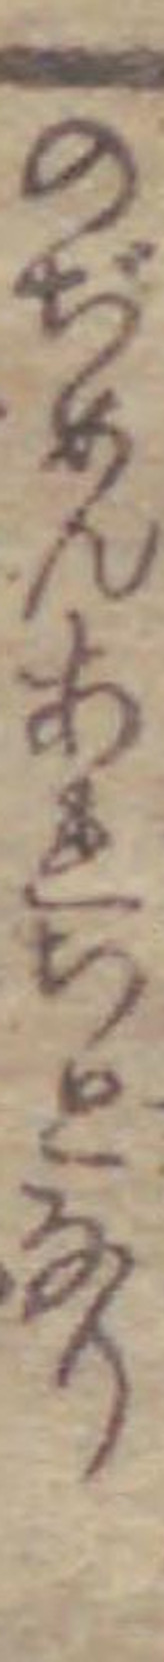のぢめんあれちとなり
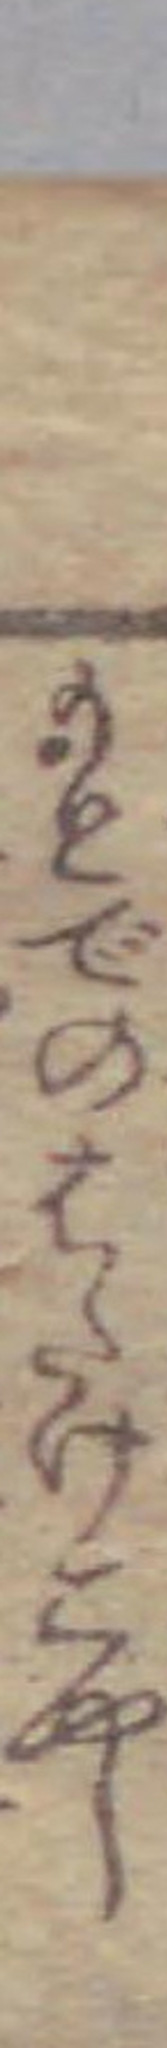もとでのはたけこやし
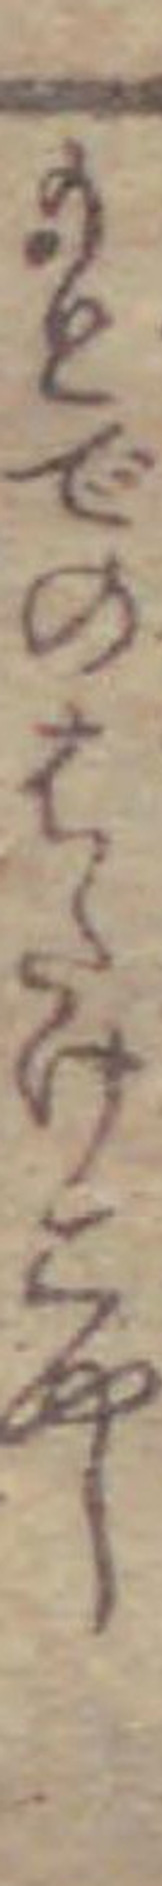もとでのはたけこやし
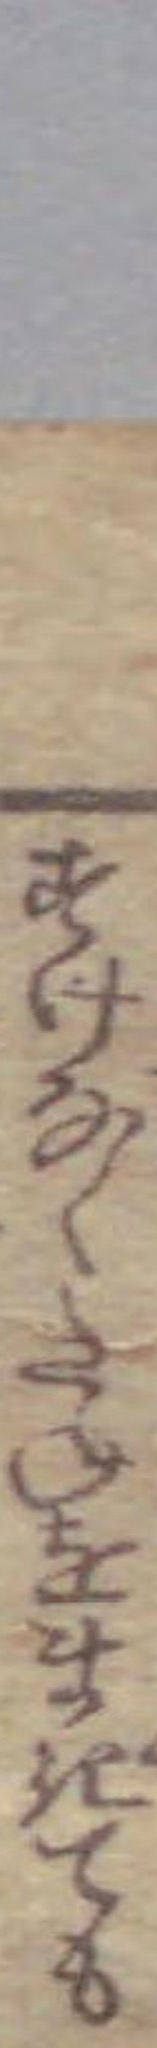すけなくたねをまきても
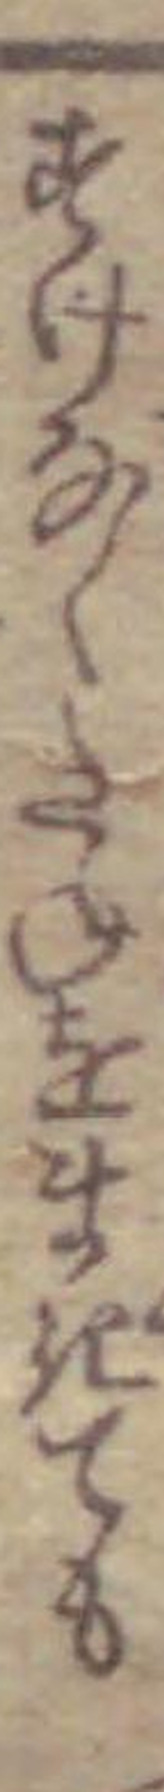すけなくたねをまきても
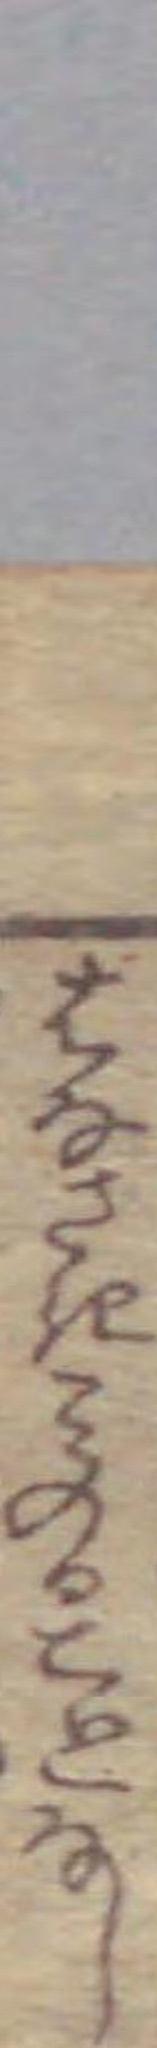はなさきみのることなし
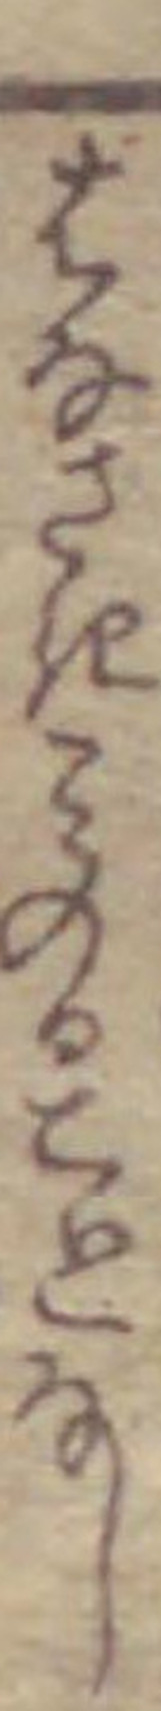はなさきみのることなし
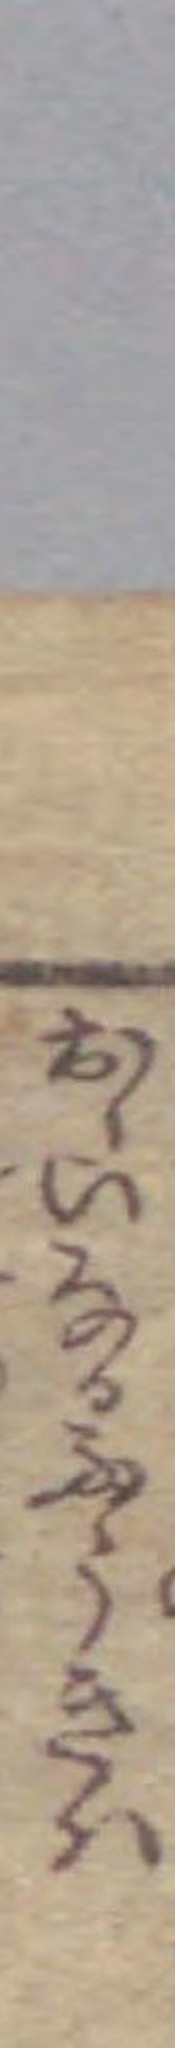おゝいなるふうきは
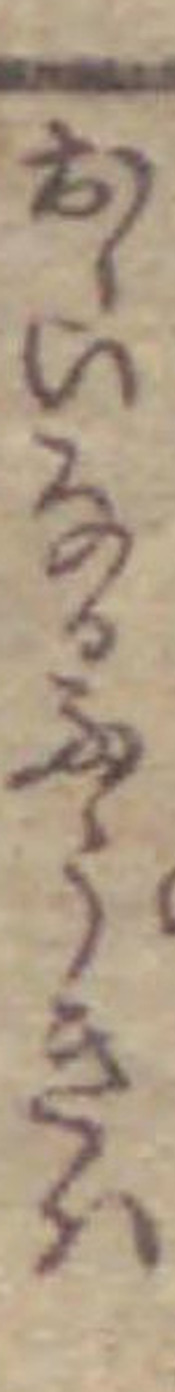おゝいなるふうきは
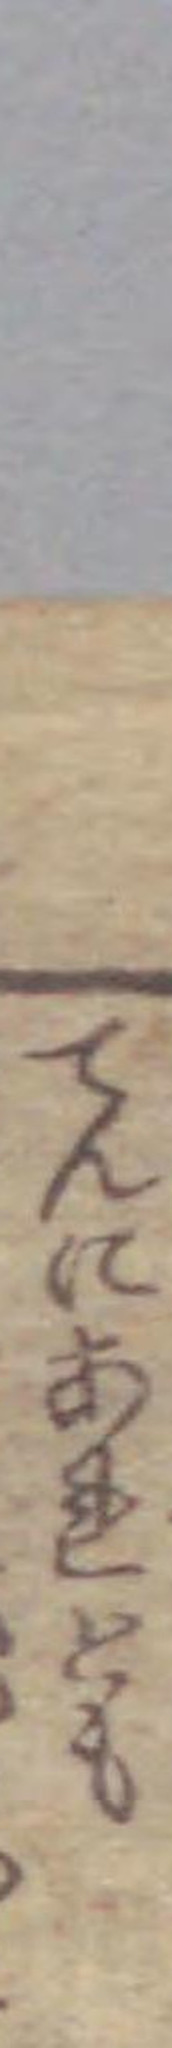てんにあれとも
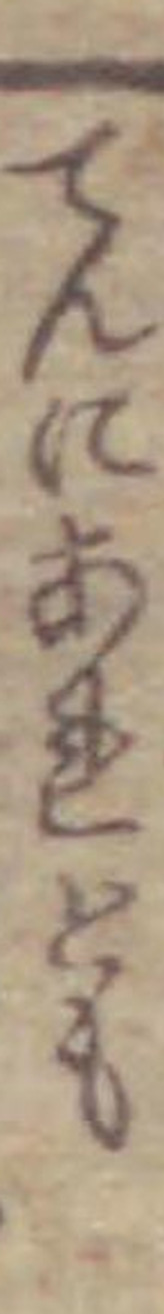てんにあれとも
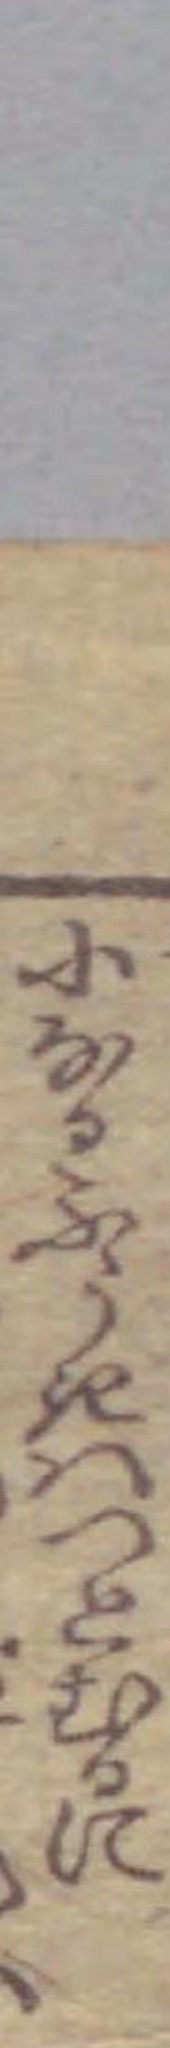小なるふうきはつとむるに
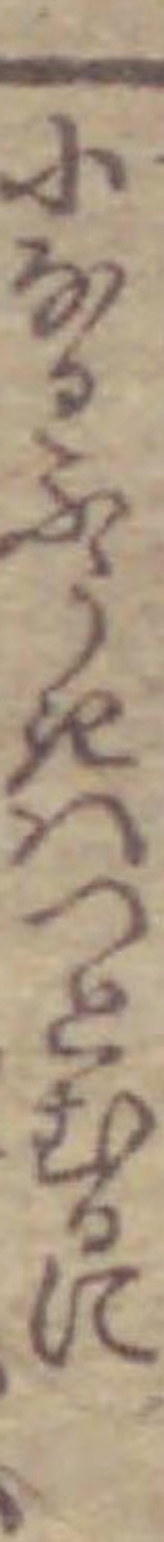小なるふうきはつとむるに
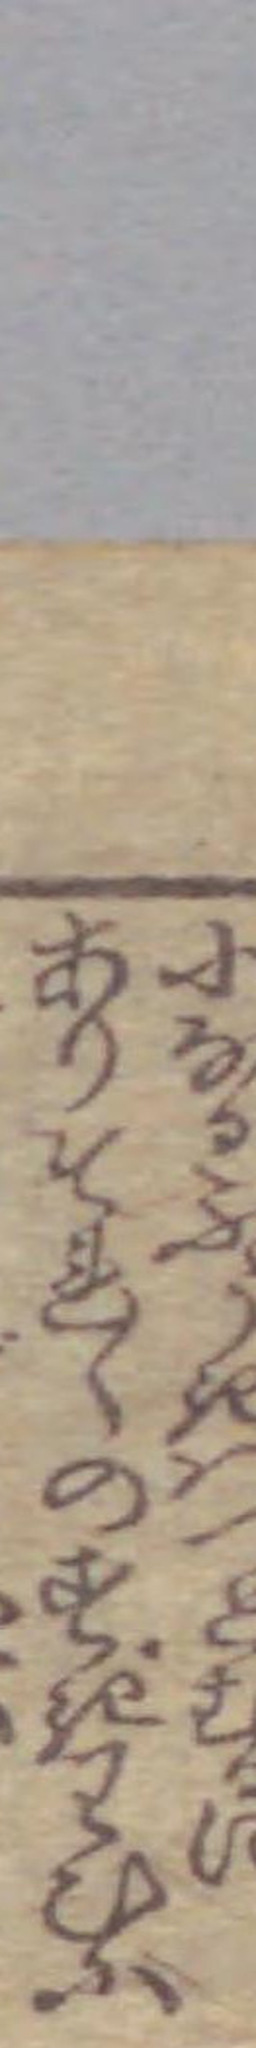ありそれ〳〵のすぎはひに
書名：化物和本草 : 3巻
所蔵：国立国会図書館 National Diet Library, JAPAN
